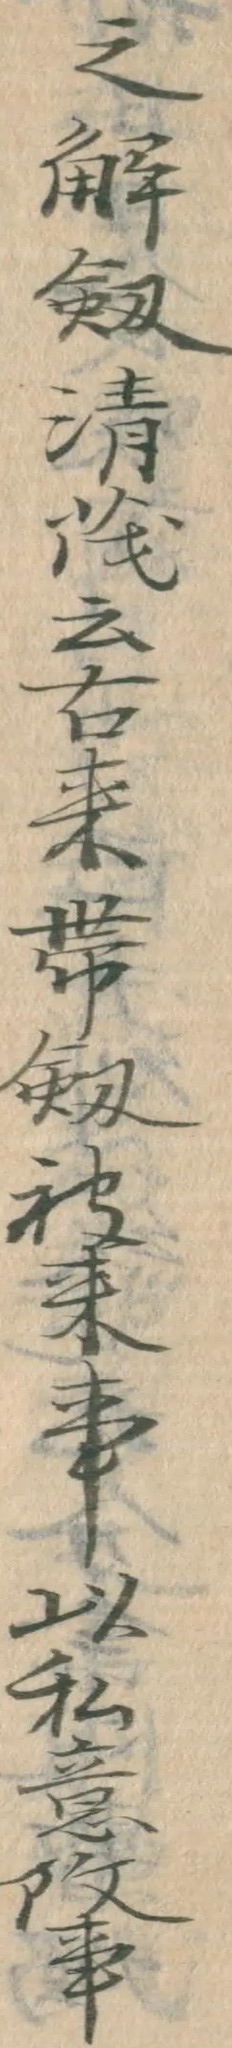之解剱清茂云古来帯剱被来事以私意改事
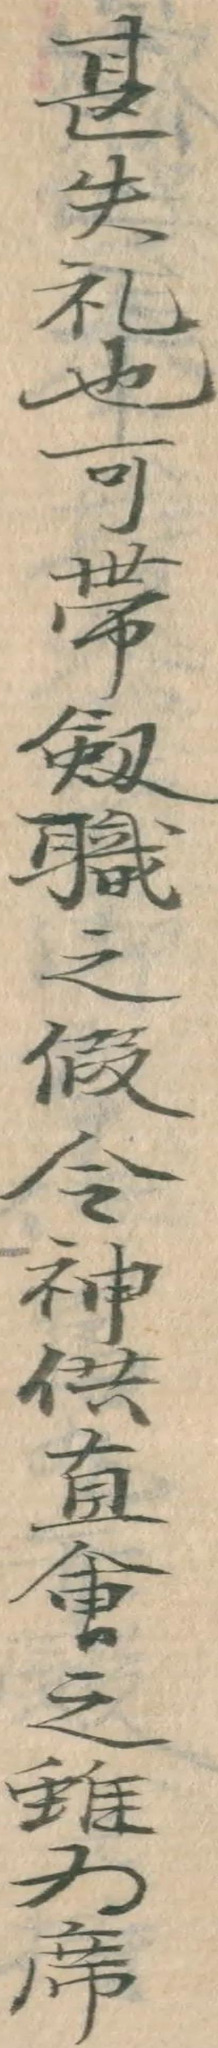甚失礼也可帯剱職之仮令神供直会之雖為席
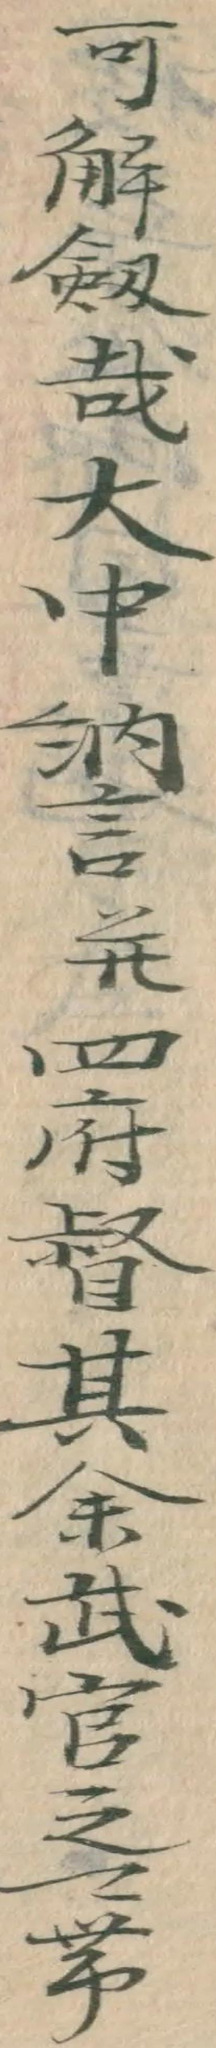可解剱哉大中納言并四府督其余武官之可帯
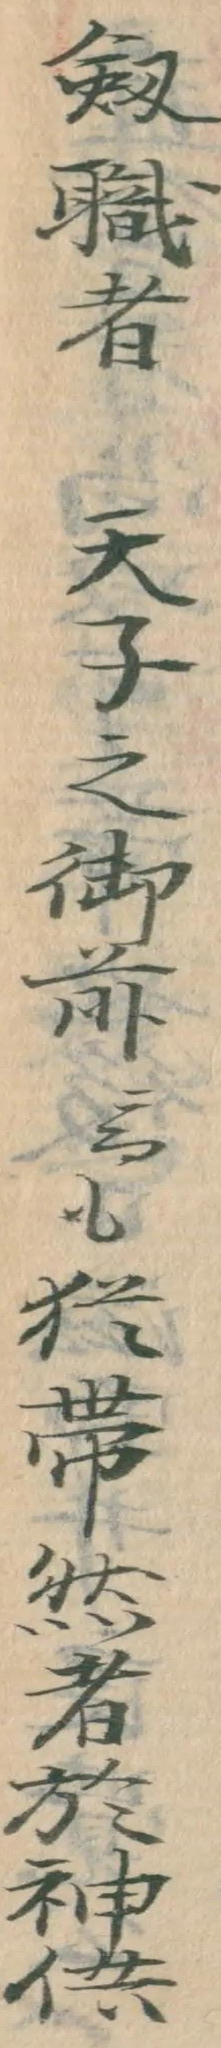剱職者天子之御前ニ而も猶帯然者於神供

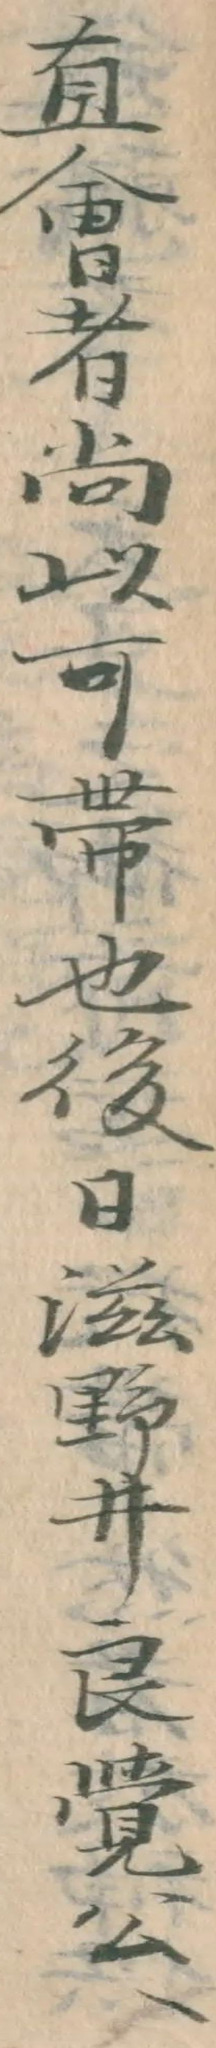直会者尚以可帯也後日滋野井良覚公へ
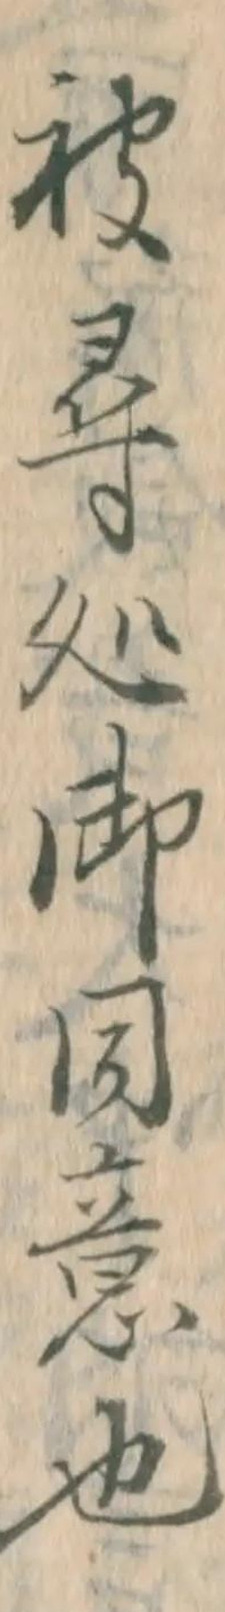被尋処御同意也
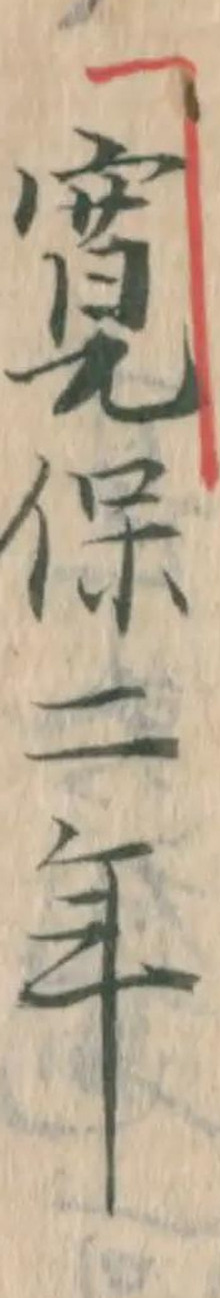寛保二年
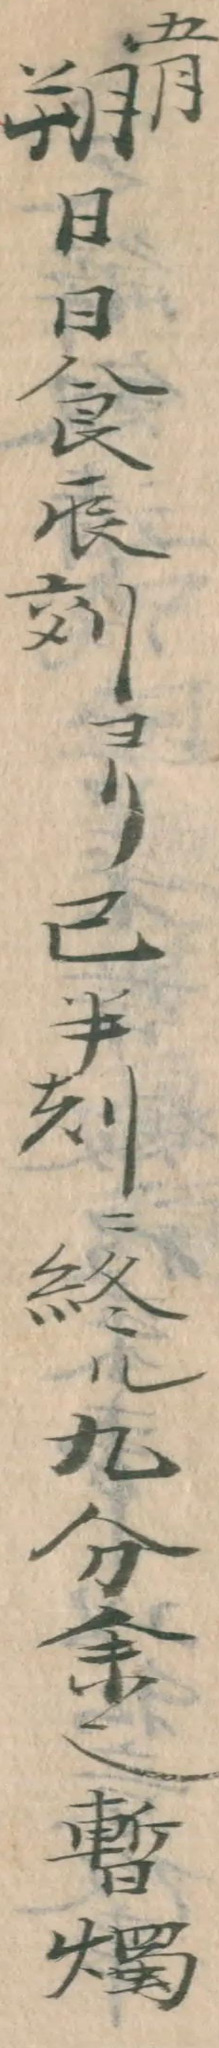朔日日食辰刻ヨリ巳半刻ニ終ル九分余也暫燭
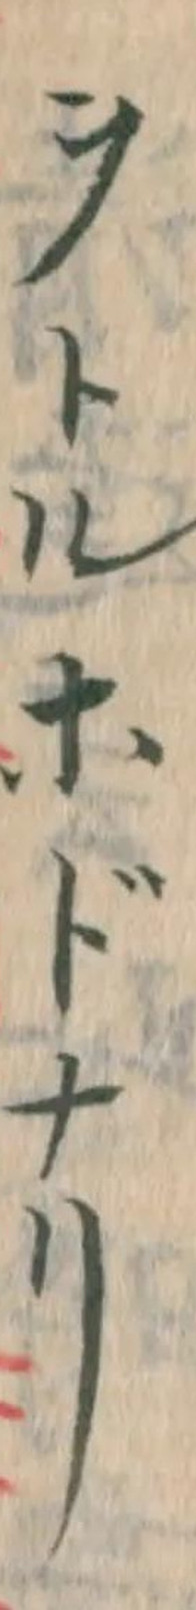ヲトルホドナリ
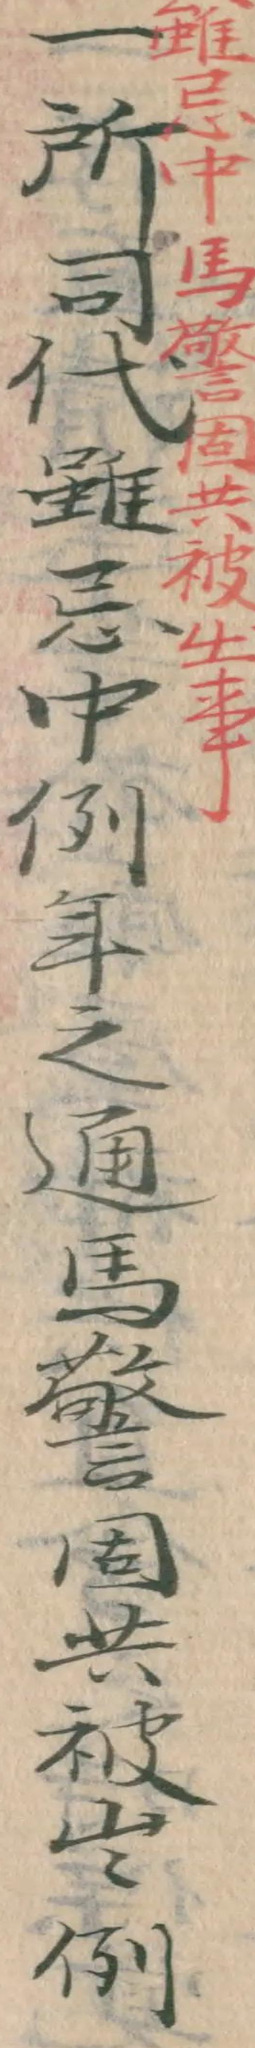一所司代雖忌中例年之通馬警固共被出例
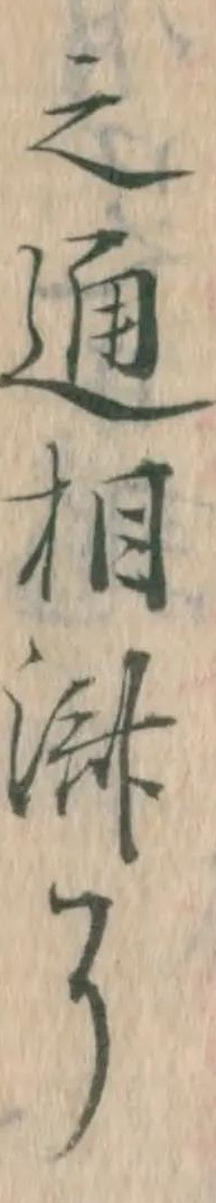之通相済了
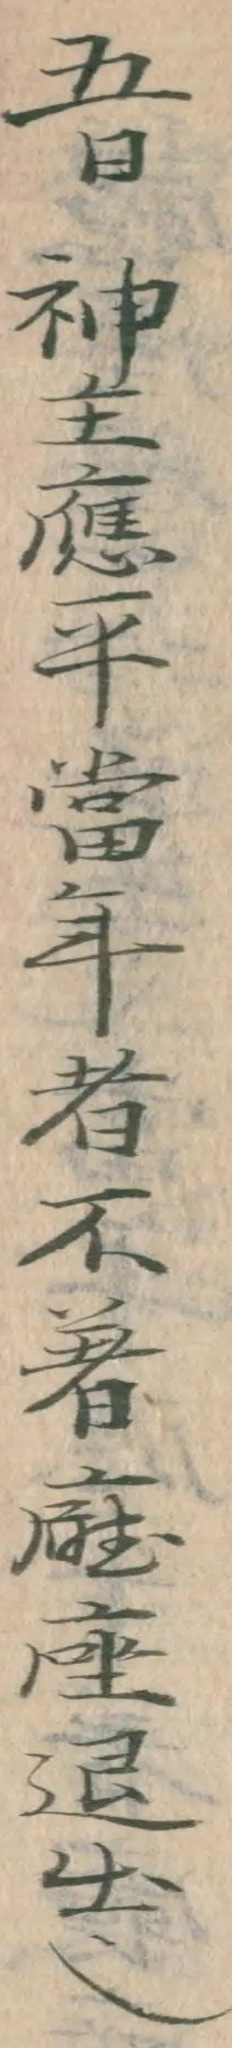五日神主応平当年者不着庁座退出也
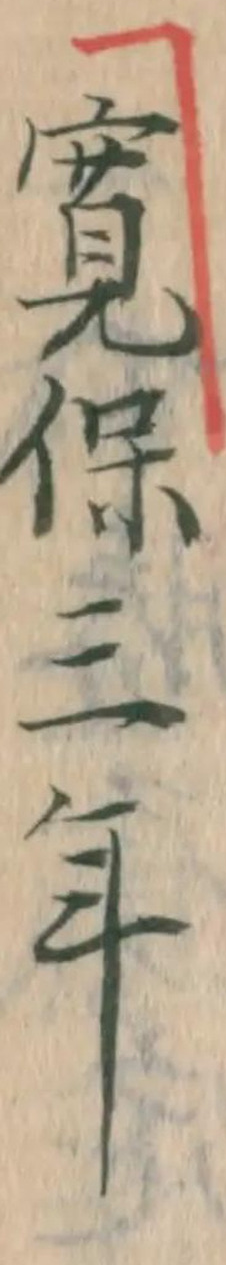寛保三年
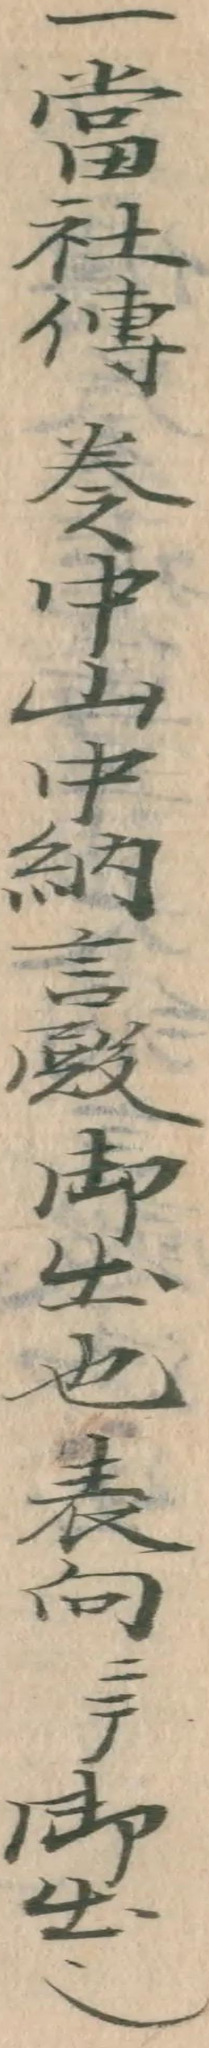一当社伝奏中山中納言殿御出也表向ニテ御出也
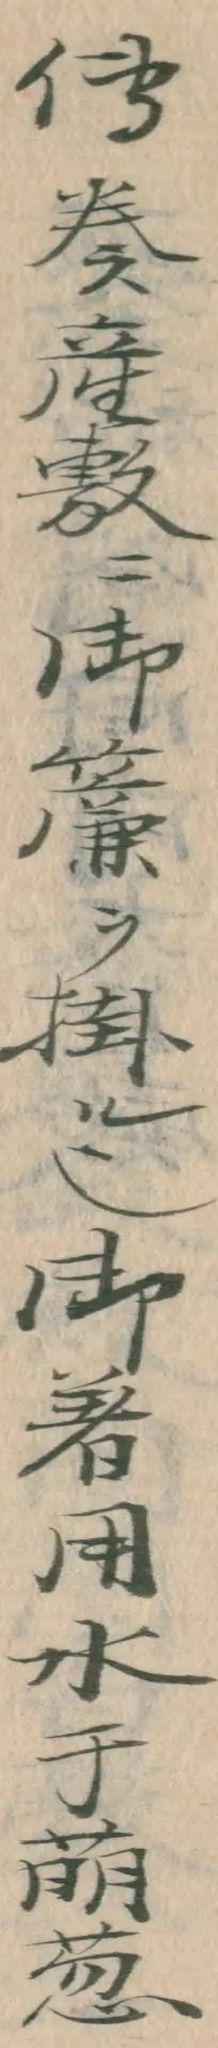伝奏産敷ニ御簾ヲ掛ル也御着用水干萌葱
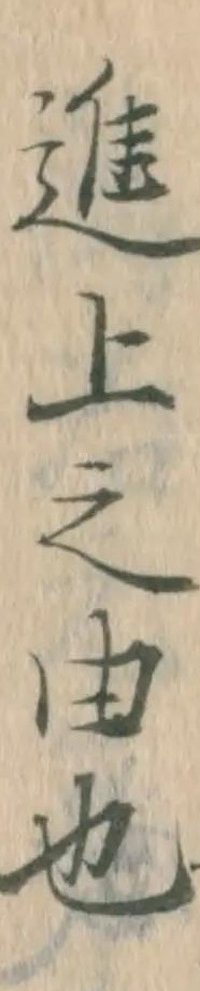進上之由也
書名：賀茂社記録. 第10冊
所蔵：国立国会図書館 National Diet Library, JAPAN
